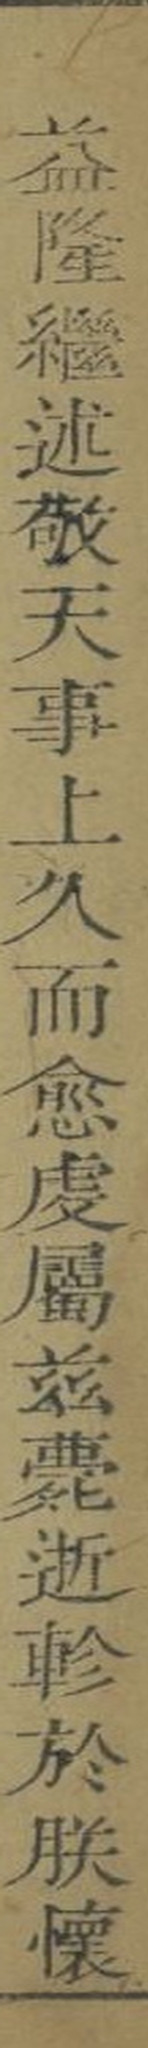益隆継述敬天事上久而愈虔属茲薨逝軫於朕懐
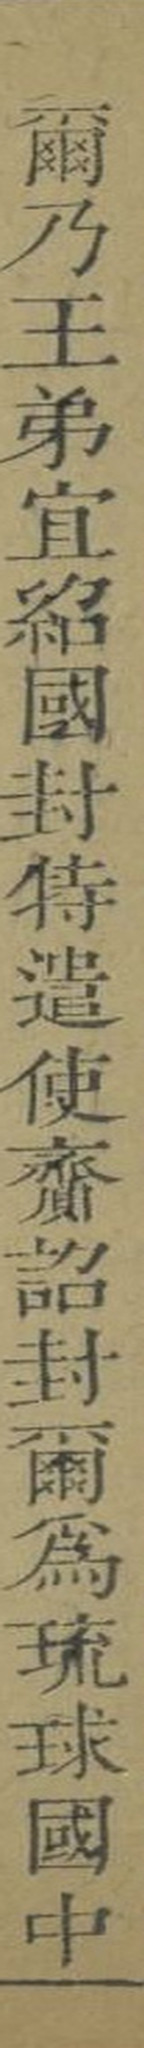爾乃王弟宜紹国封特遣使齎詔封爾為琉球国中
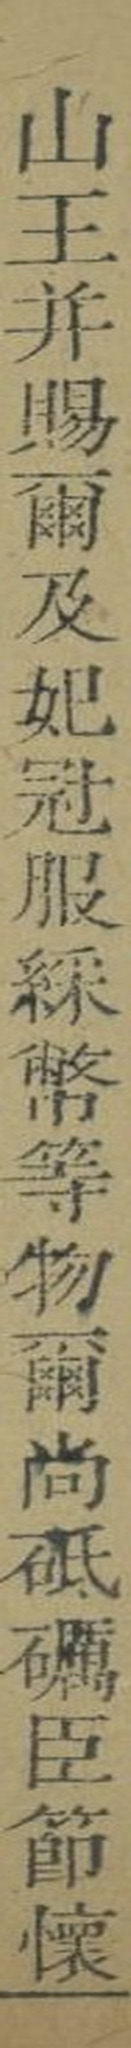山王并賜爾及妃冠服綵幣等物爾尚砥礪臣節懐
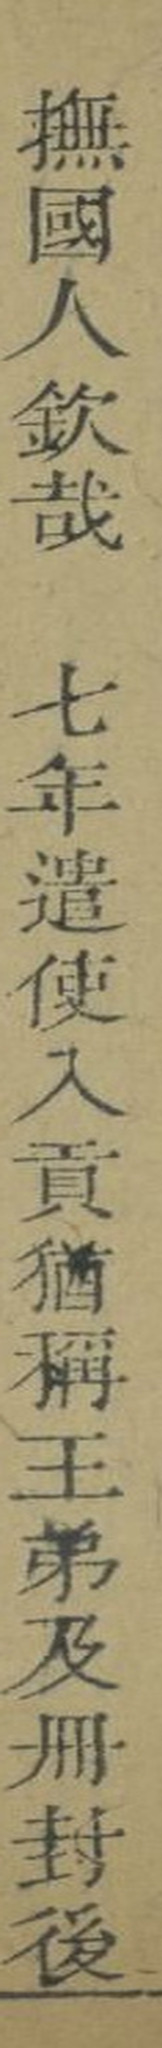撫国人欽哉七年遣使入貢猶称王弟及冊封後
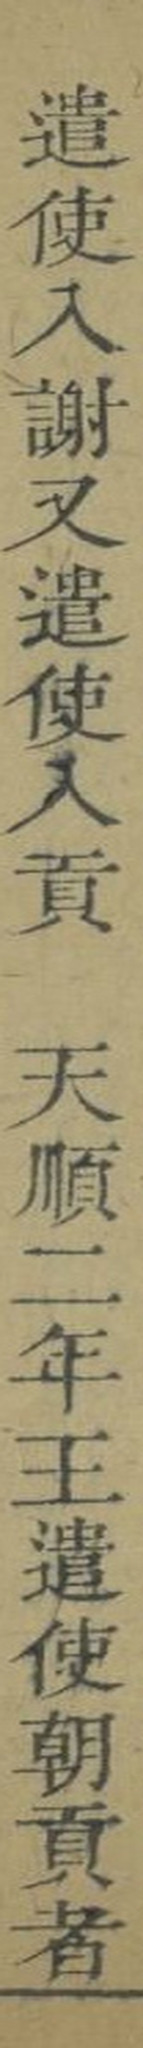遣使入謝又遣使入貢天順二年王遣使朝貢者
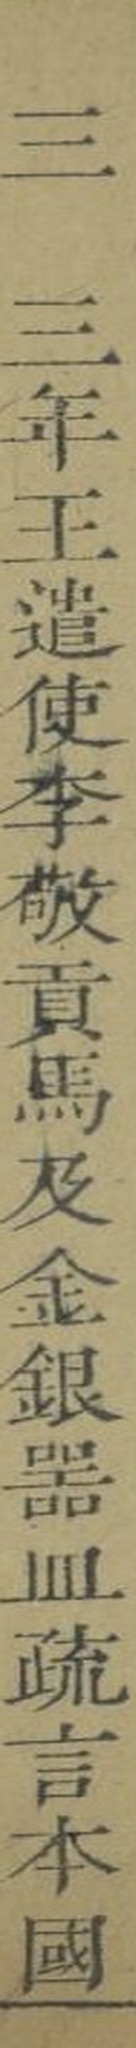三三年王遣使李敬貢馬及金銀器皿疏言本国
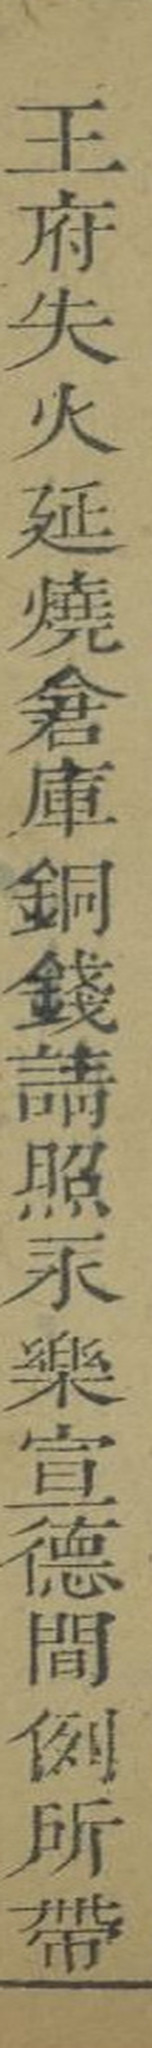王府失火延焼倉庫銅銭請照永楽宣徳間例所帯
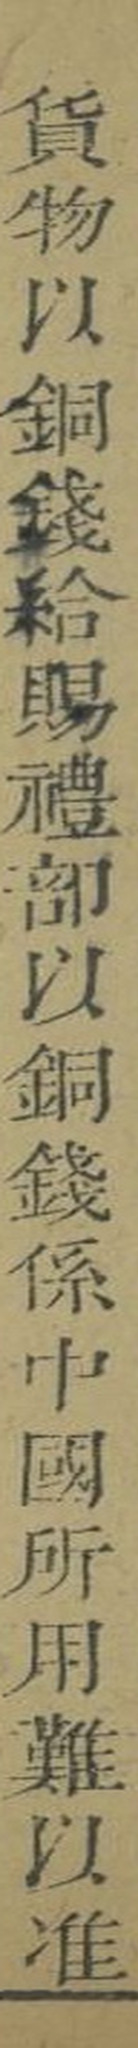貨物以銅銭給賜礼部以銅銭係中国所用難以准
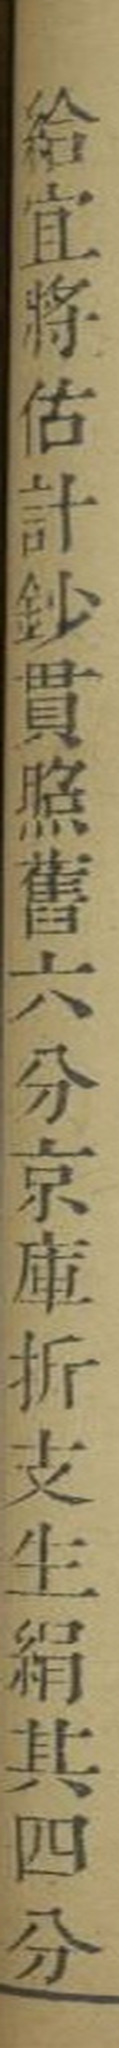給宜将估計鈔貫照旧六分京庫折支生絹其四分
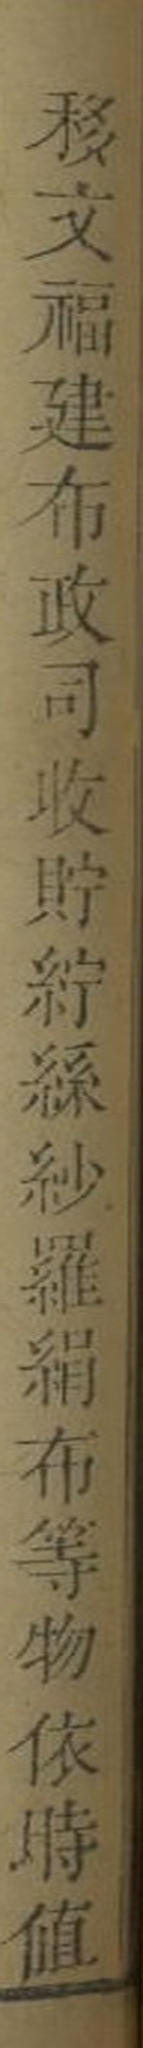移文福建布政司収貯紵糸紗羅絹布等物依時値
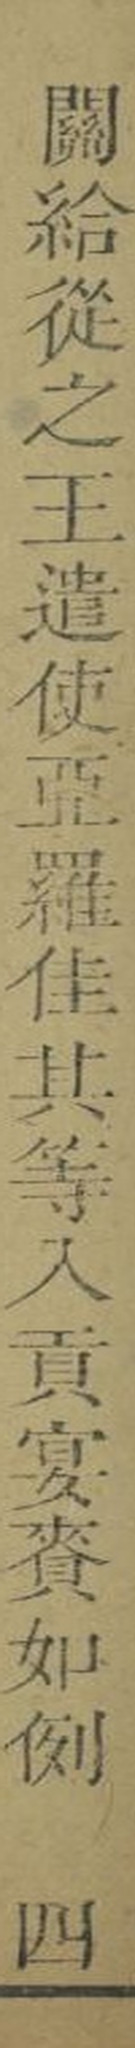関給従之王遣使亜羅佳其等入貢宴賚如例四
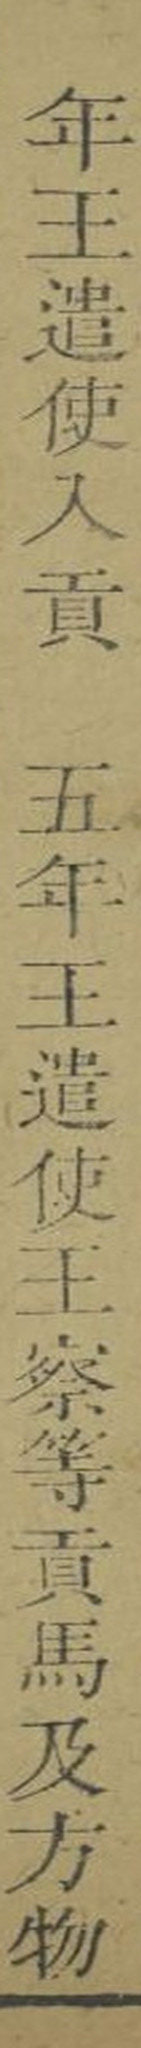年王遣使入貢五年王遣使王察等貢馬及方物
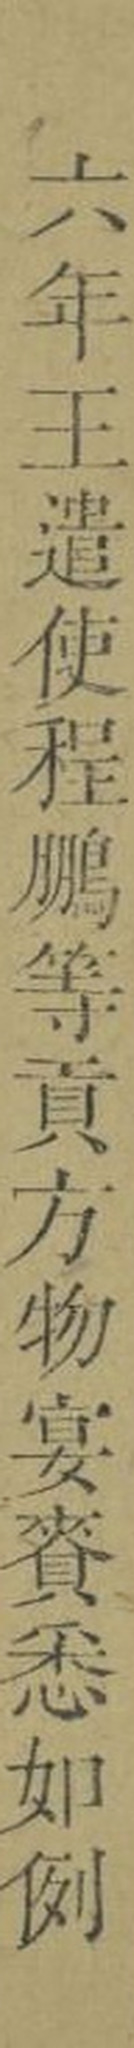六年王遣使程鵬等貢方物宴賚悉如例
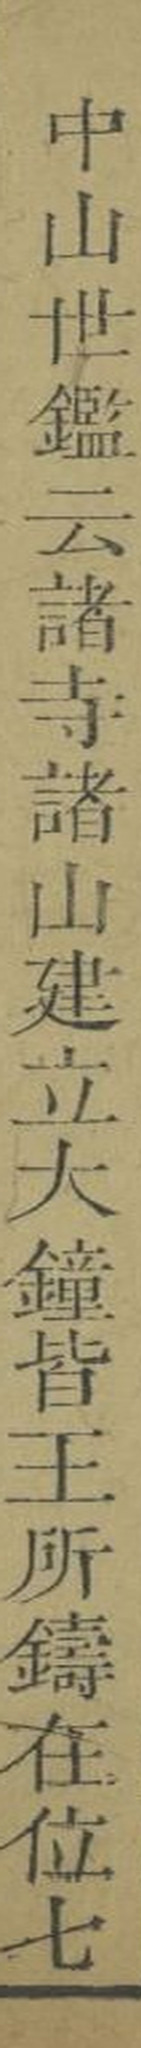中山世鑑云諸寺諸山建立大鐘皆王所鋳在位七
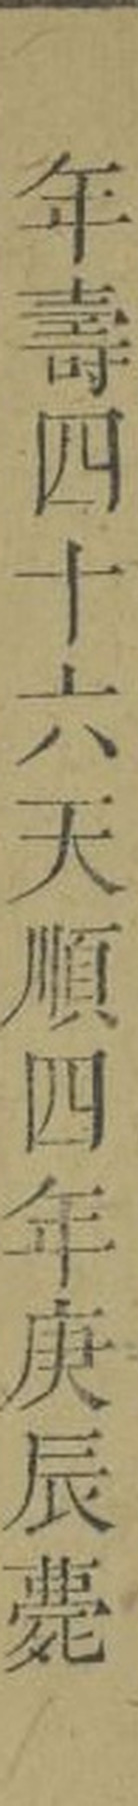年寿四十六天順四年庚辰薨
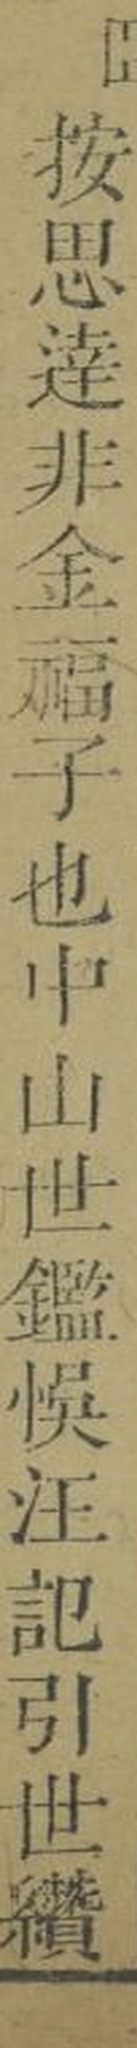臣按思達非金福子也中山世鑑悞汪記引世纘
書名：中山伝信録 巻三
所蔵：University of the Ryukyus Library
